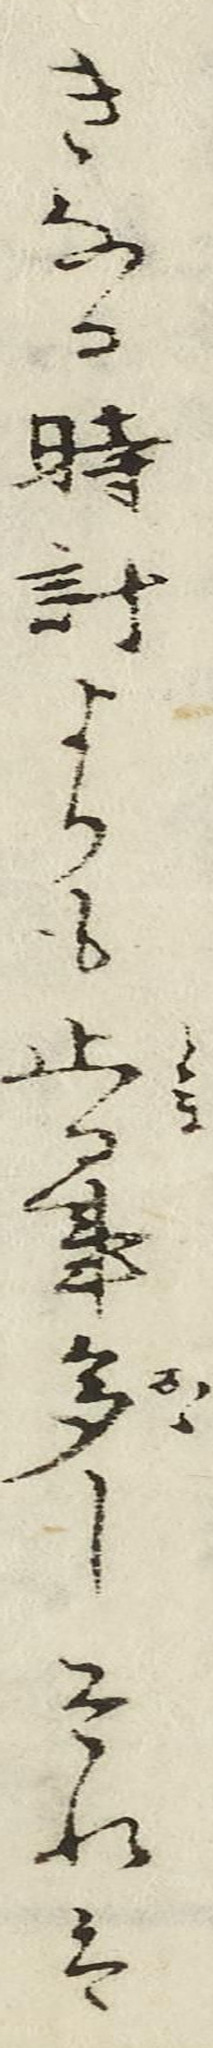きなる時計よりも止る事多しそれは
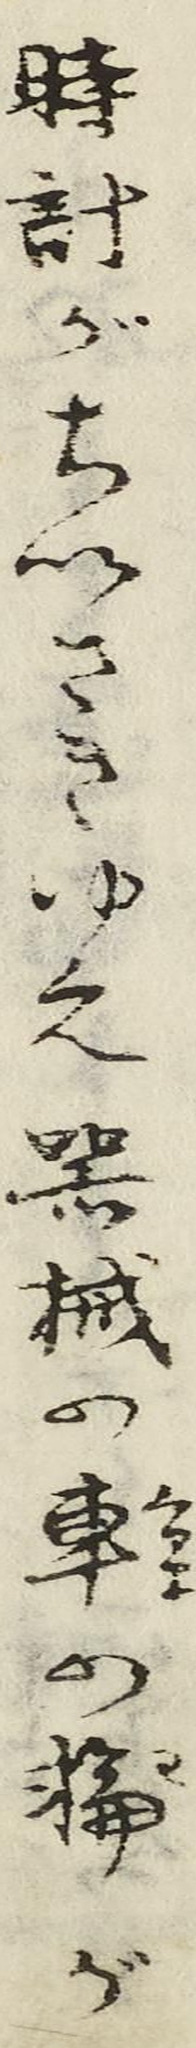時計がちいさきゆえ器械の車の輪が
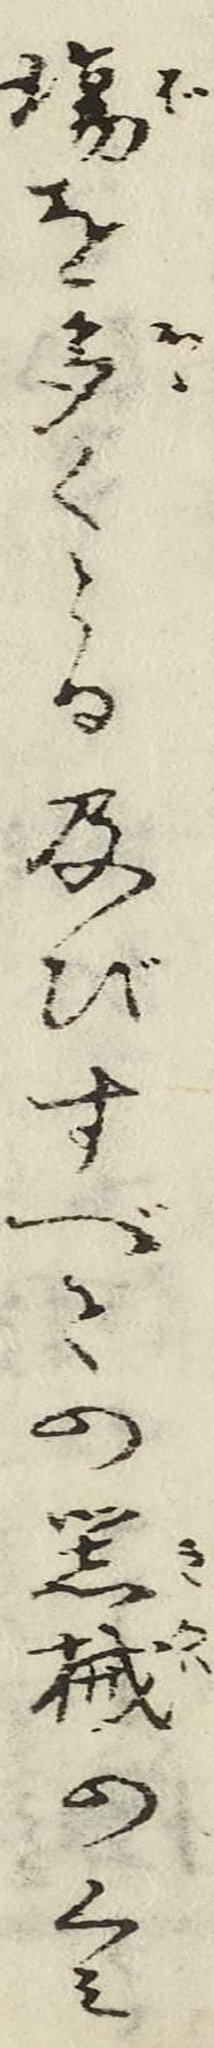場を多くとる及びすべての器械のくみ
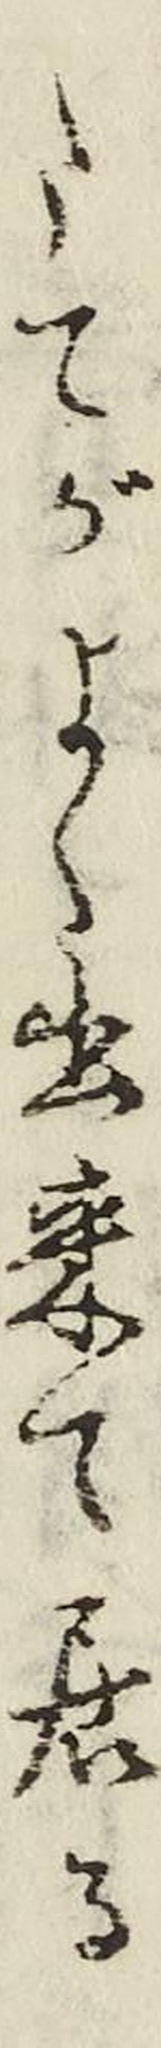たてがよく出来て居る
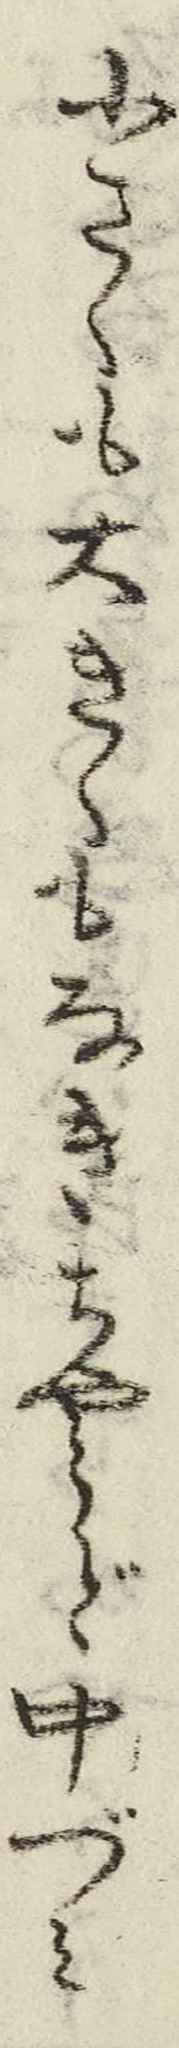小さくも大きくもなきちやうど中づみ
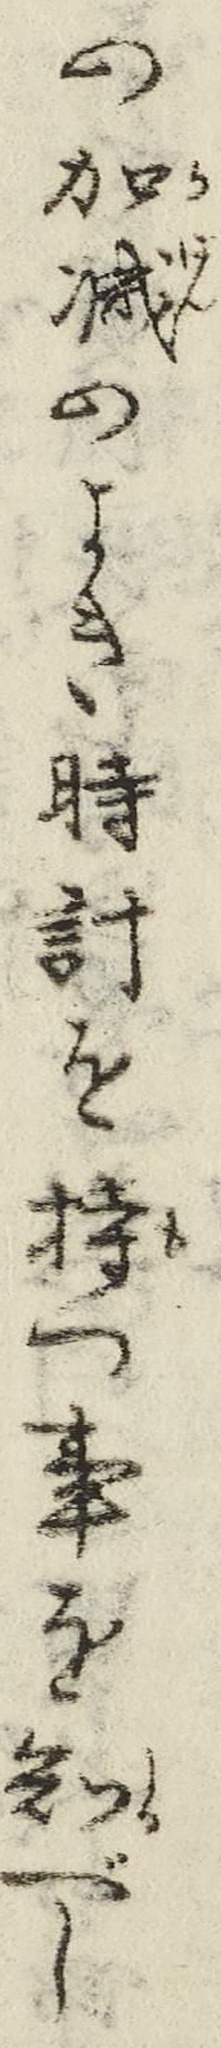の加減のよき時計を持つ事を知べし
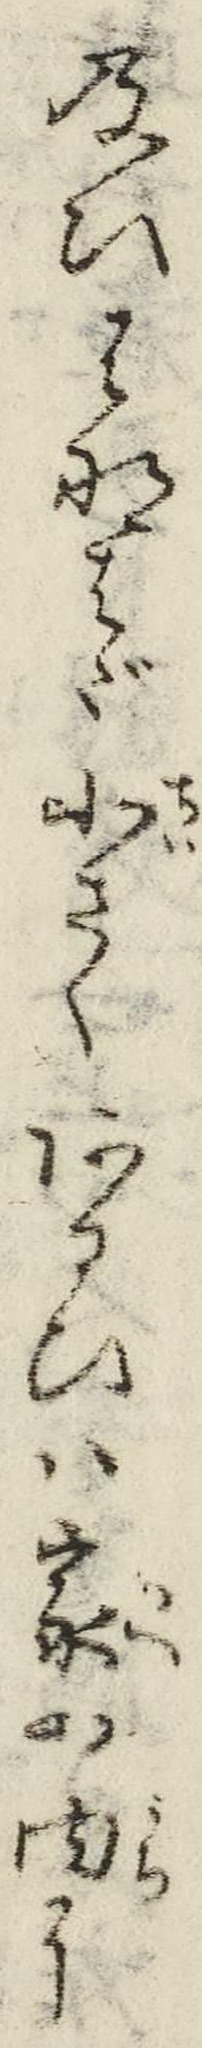及ひはなはだ小さくあるひは家の内に
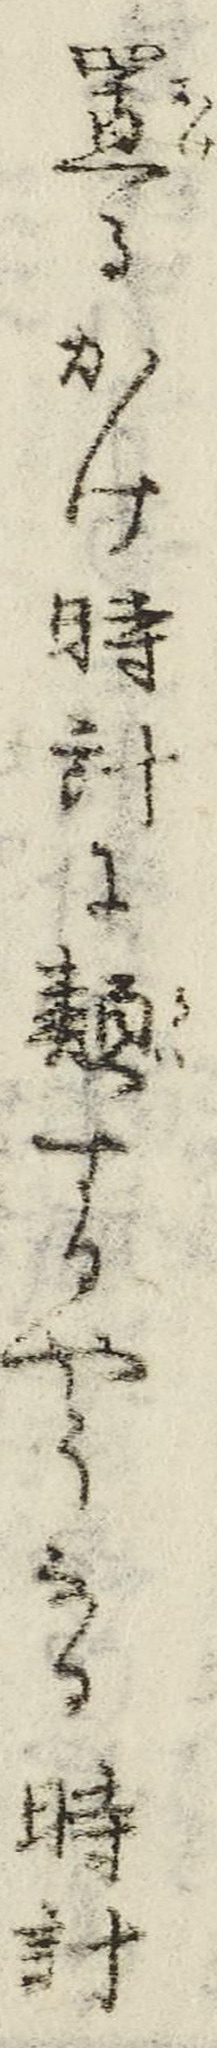置るかけ時計に類するやうなる時計
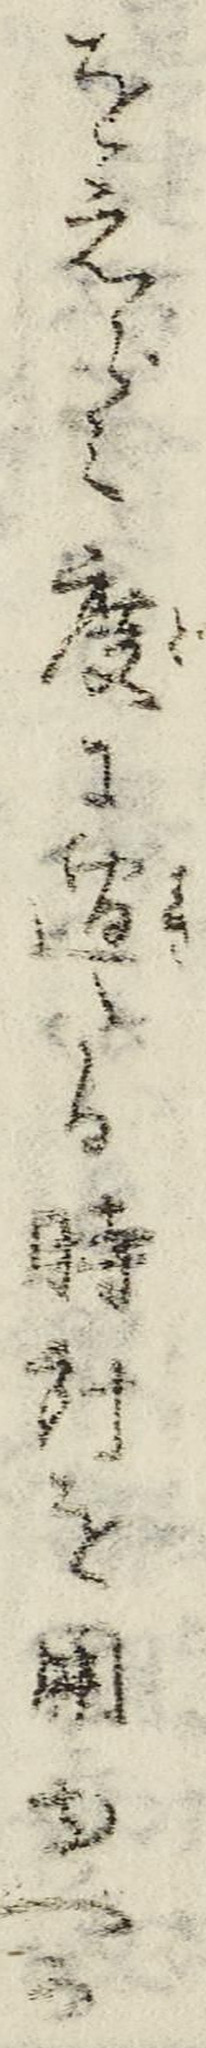をえらみ度に遁たる時計を用ゆべか
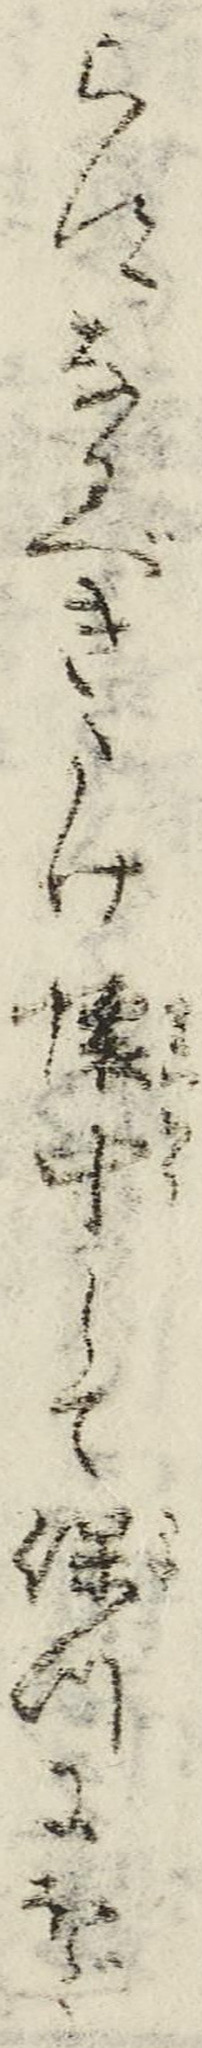らすなるべきたけ懐中して保つにほど
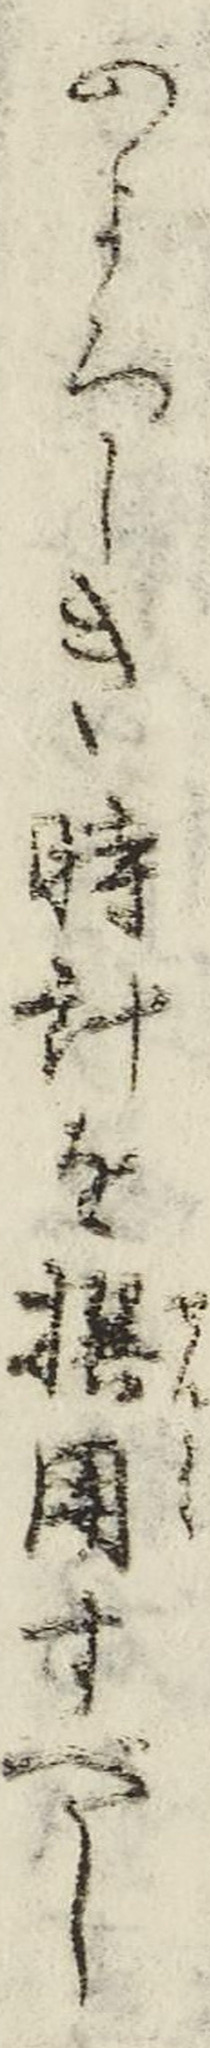のよろしき時計を撰用すべし
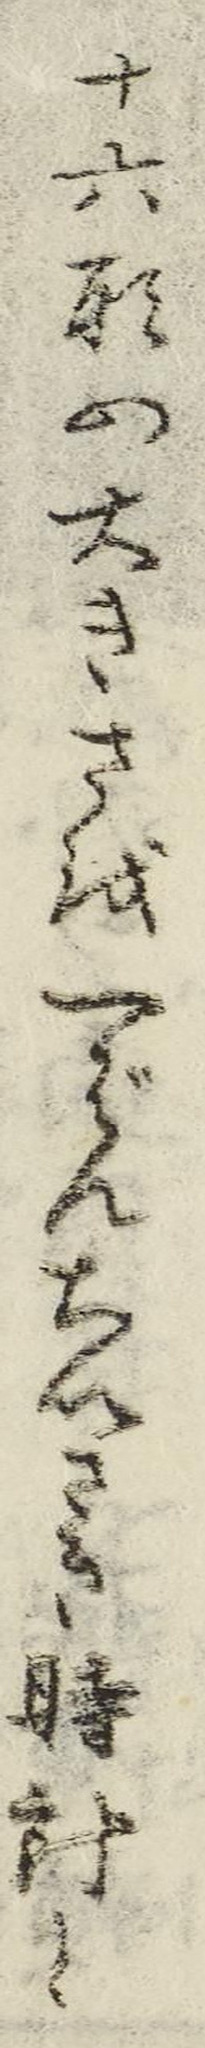十六形の大きさを一ばんちいさき時計と
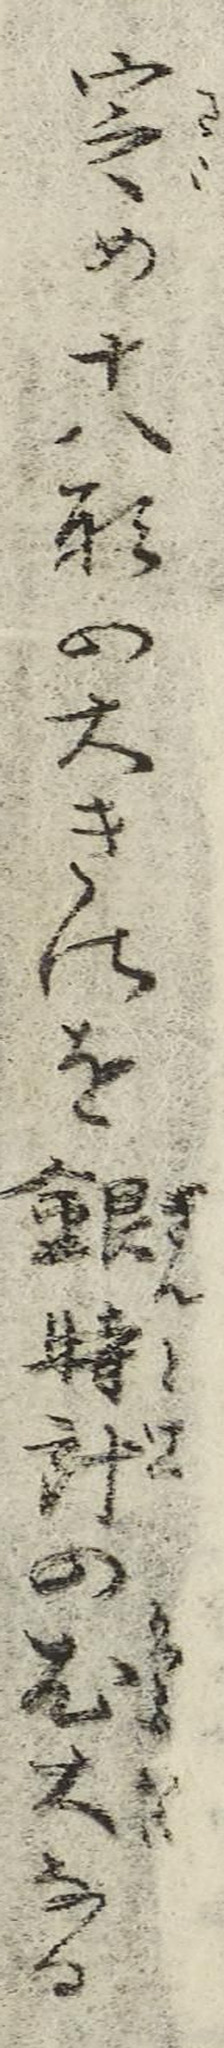定め十八形の大きさを銀時計の尤大なる
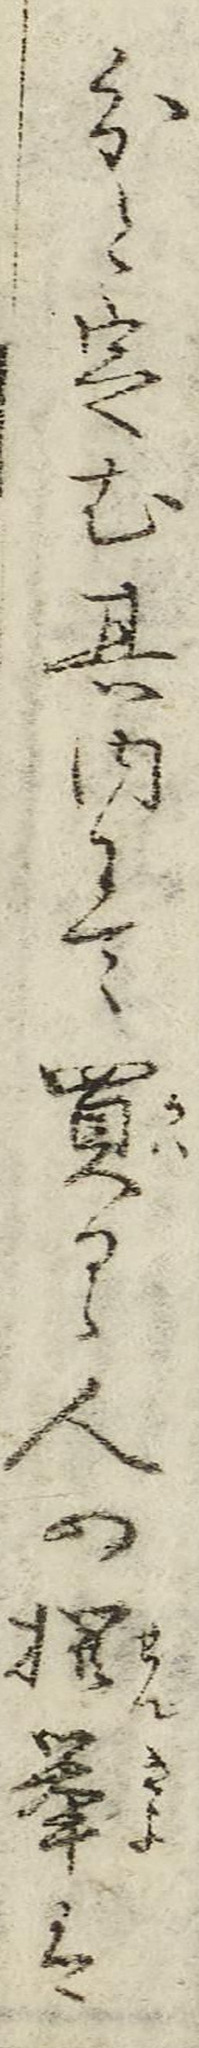分と定む其内にて買るゝ人の撰挙は

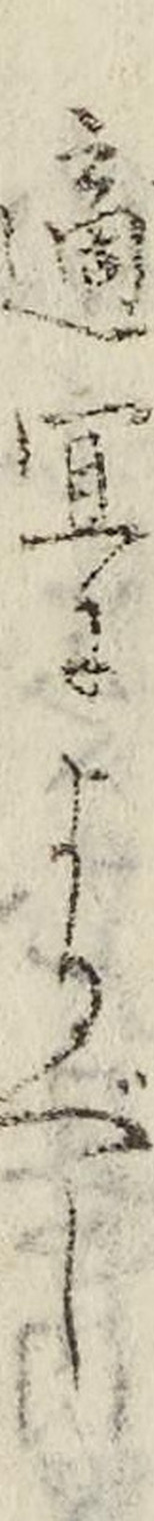適宜によるべし
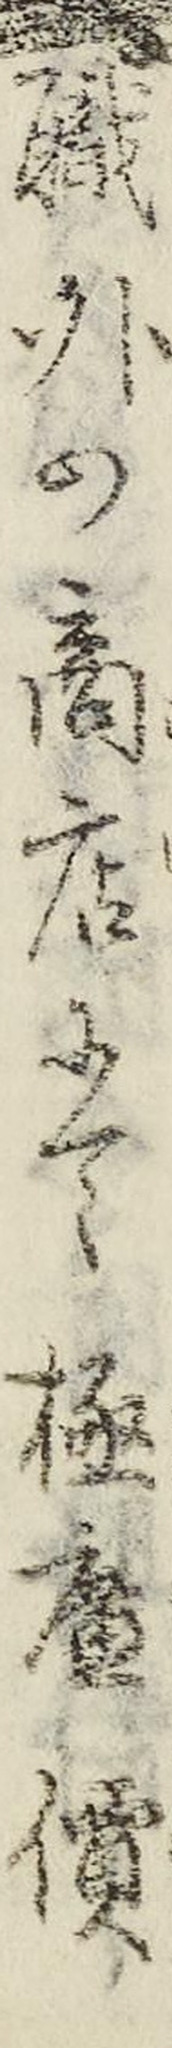職外の商店にて極廉価
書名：[時計に関する冊子]
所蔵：東京大学地震研究所図書室 Earthquake Research Institute Library, The University of Tokyo, JAPAN
